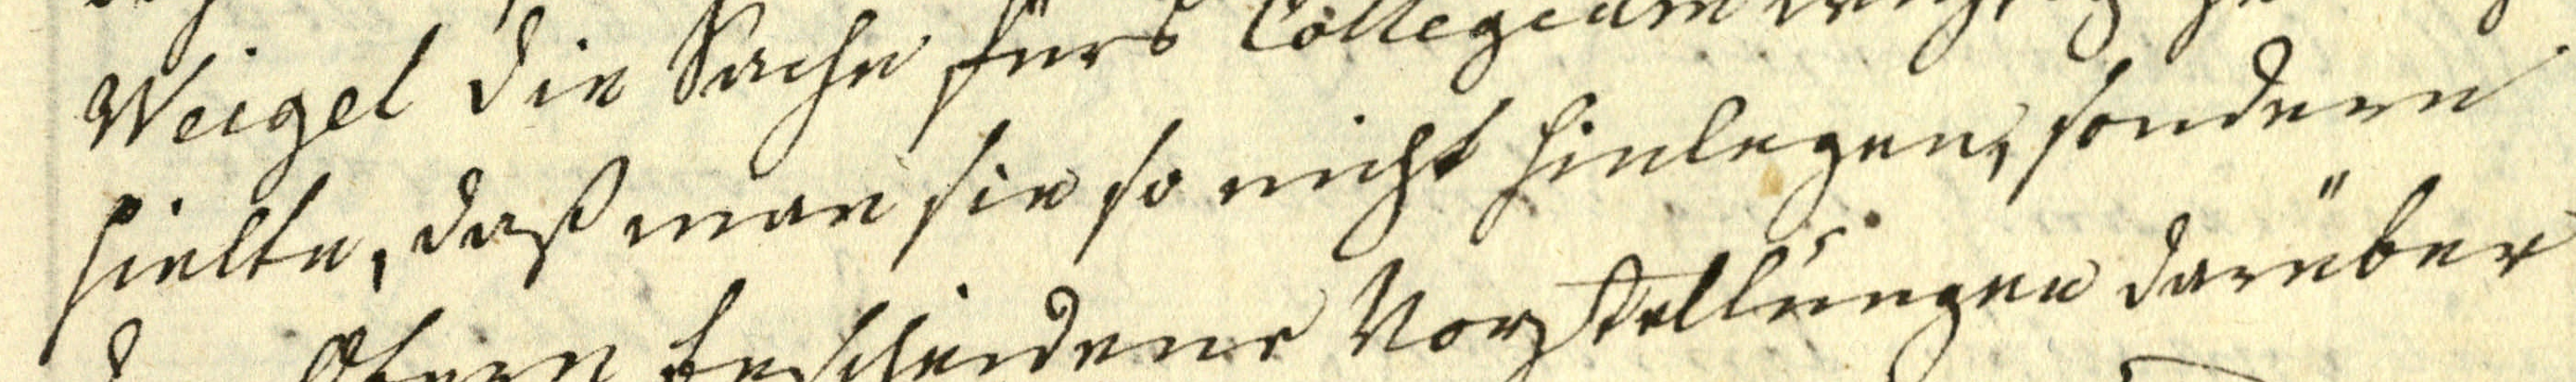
hielte, daß man sie so nicht hinlegen, sondern
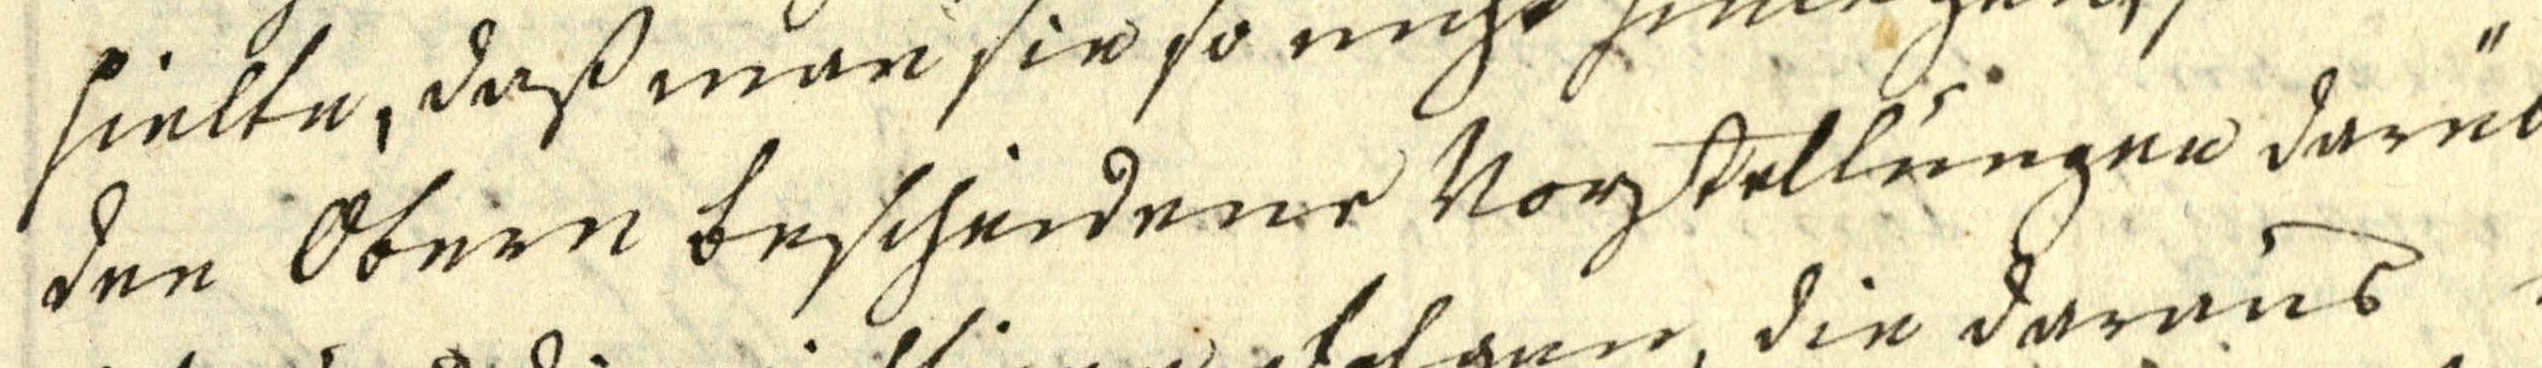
den Obern bescheidene Vorstellungen darüber
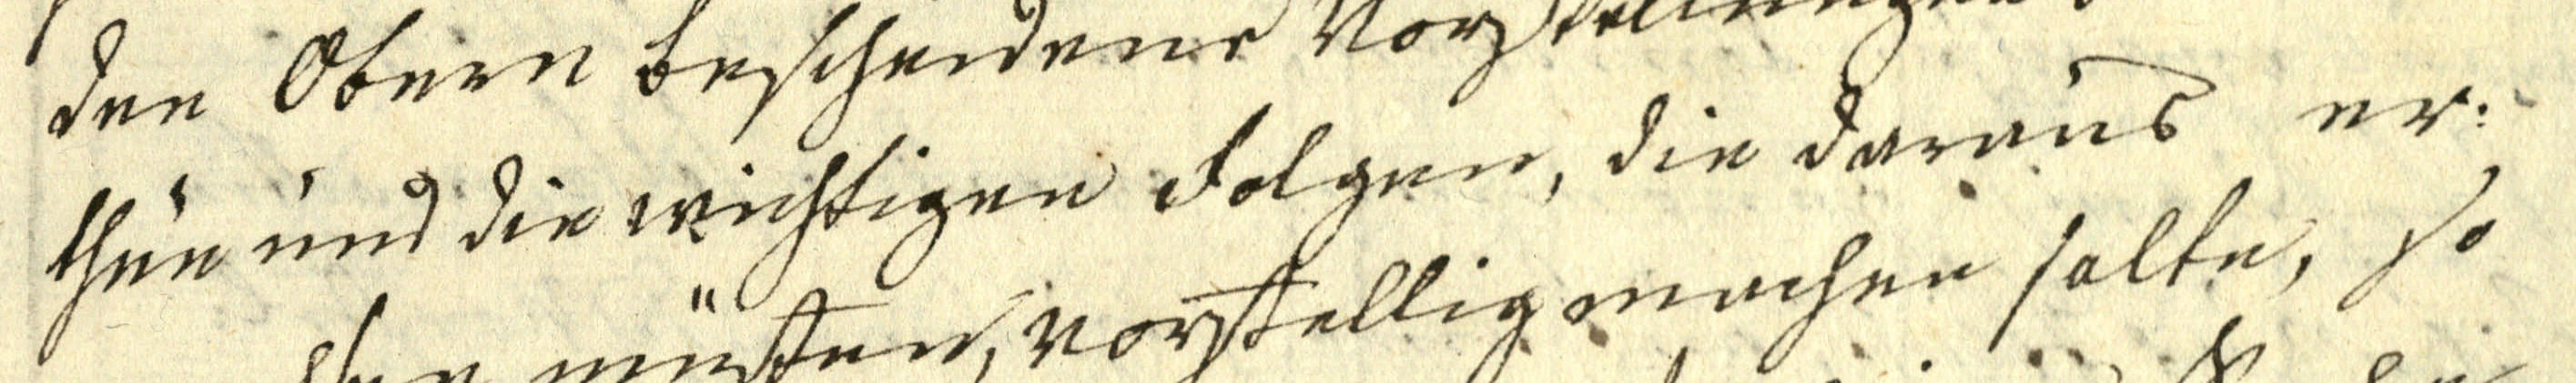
thun und die wichtigen Folgen, die daraus er¬
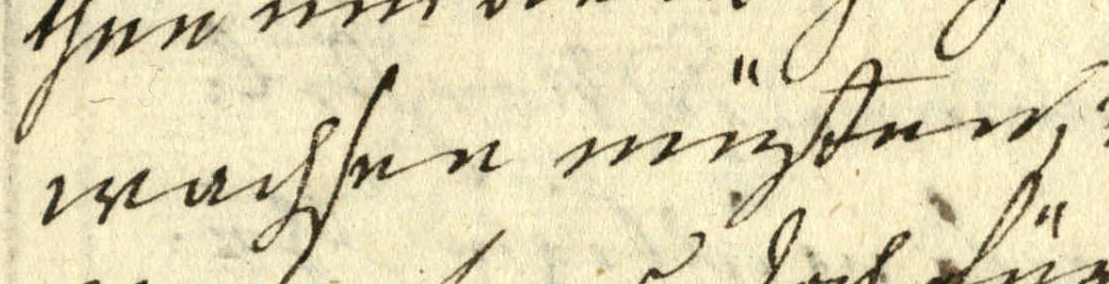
wachsen müßten, vorstellig machen solte, so
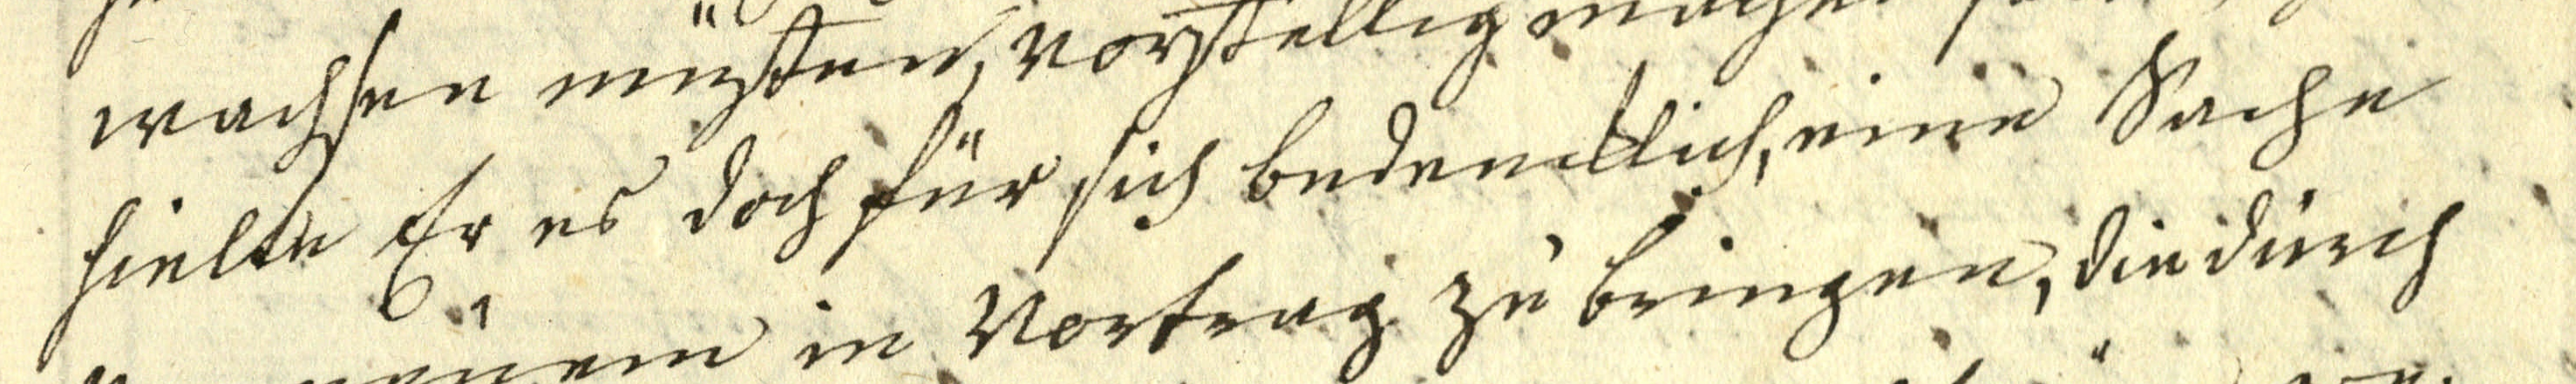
hielte Er es doch für sich bedenklich, eine Sache
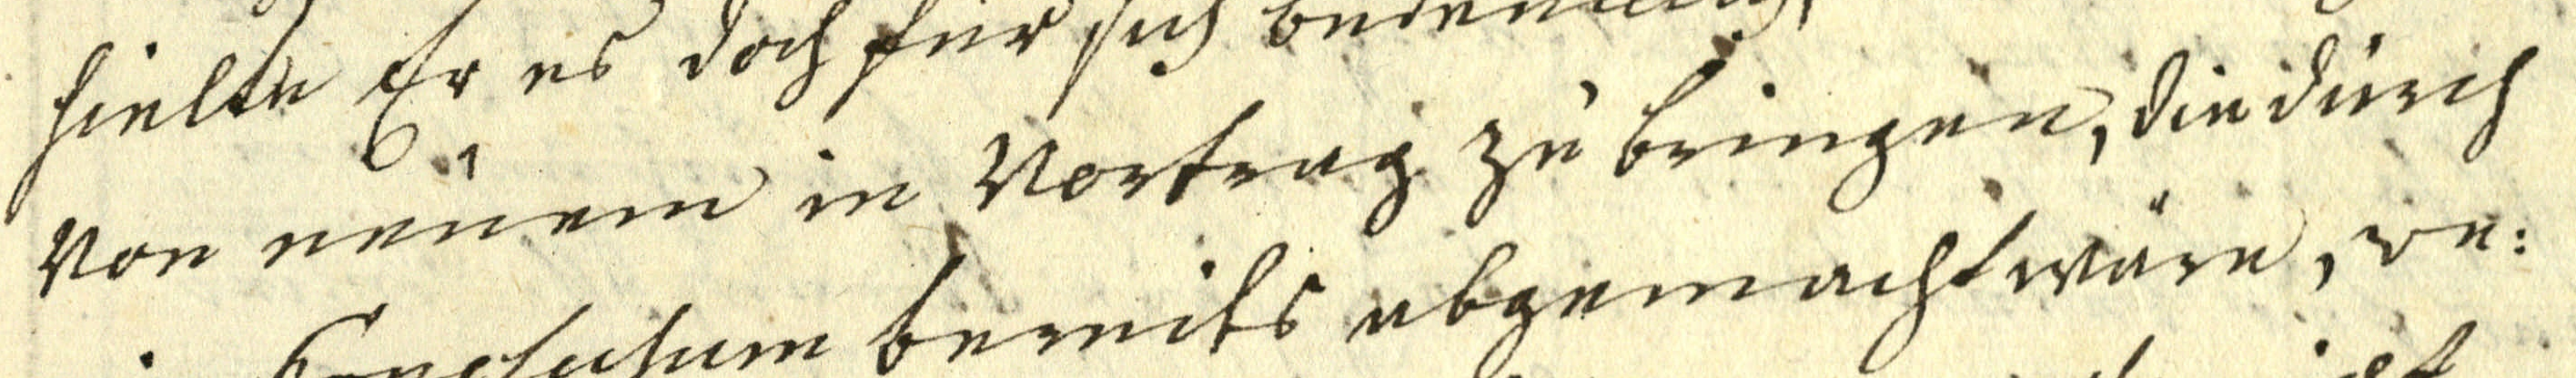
von neuem in Vortrag zu bringen, die durch
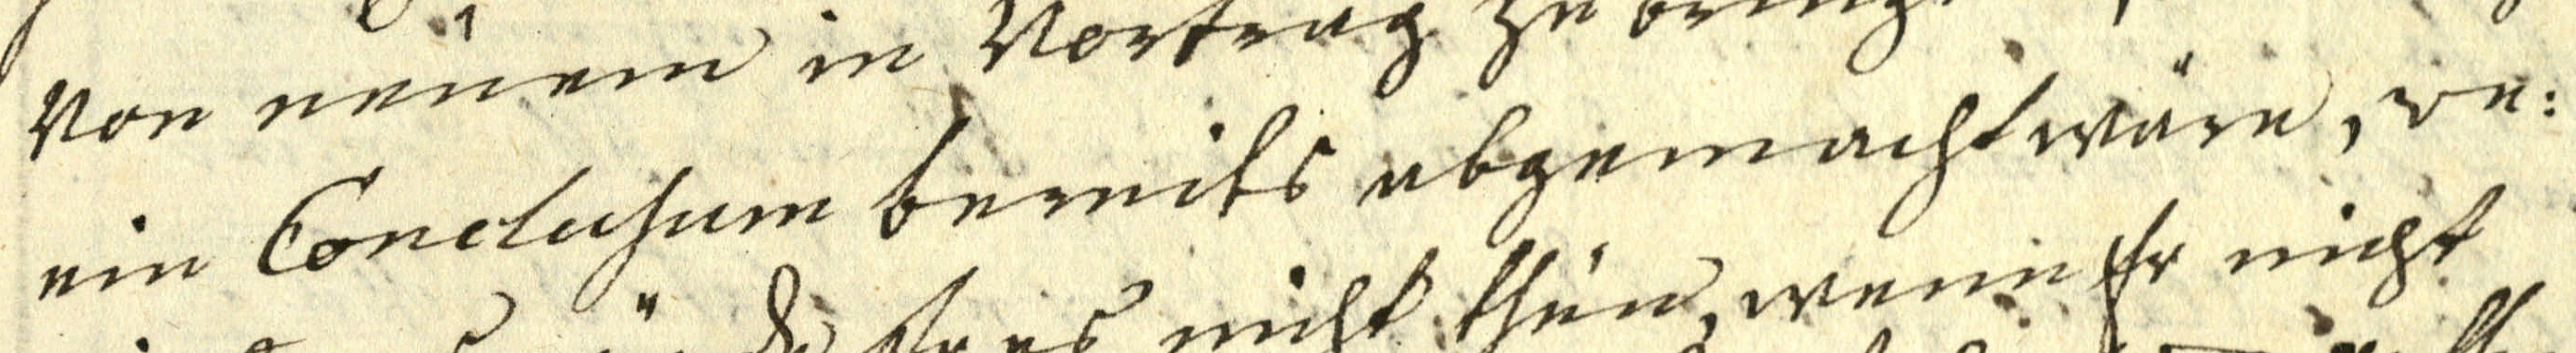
ein Conclusum bereits abgemacht wäre, we¬
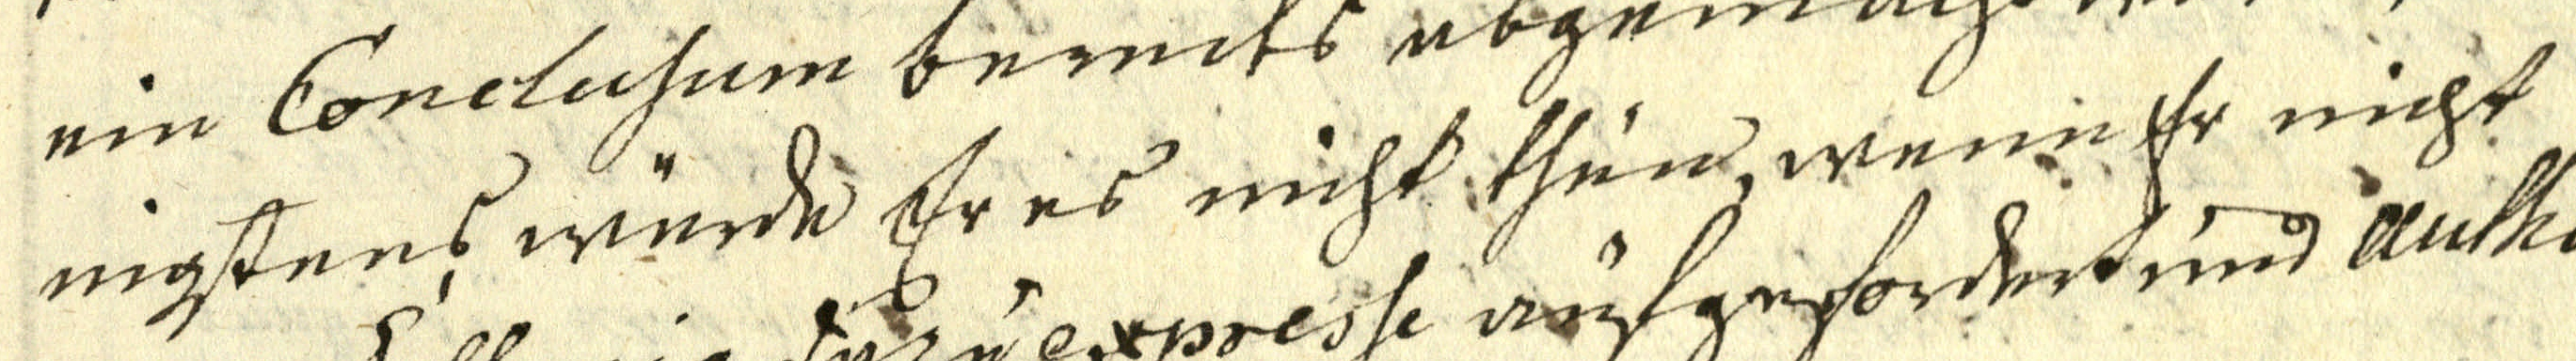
nigstens würde Er es nicht thun, wenn Er nicht
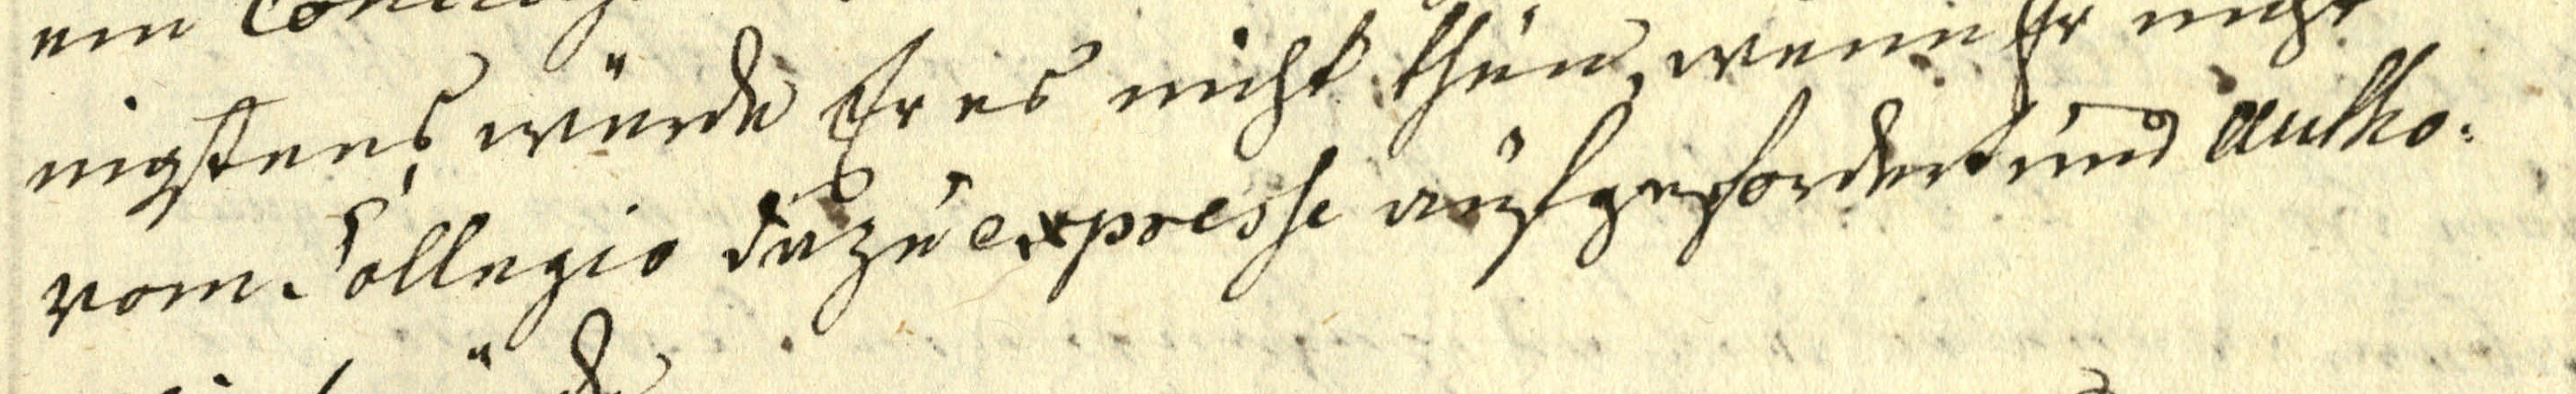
vom Collegio dazu expresse aufgefordert und autho¬
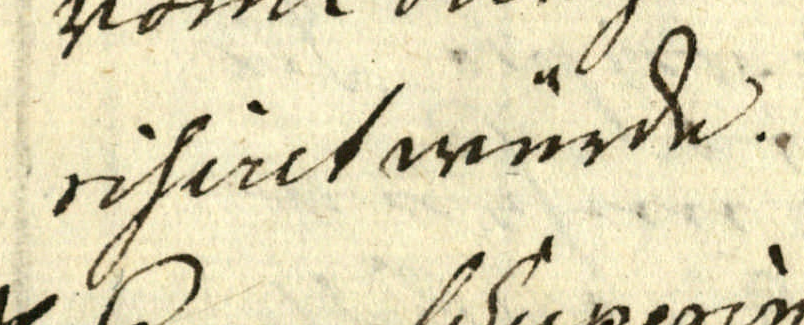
risiret würde.
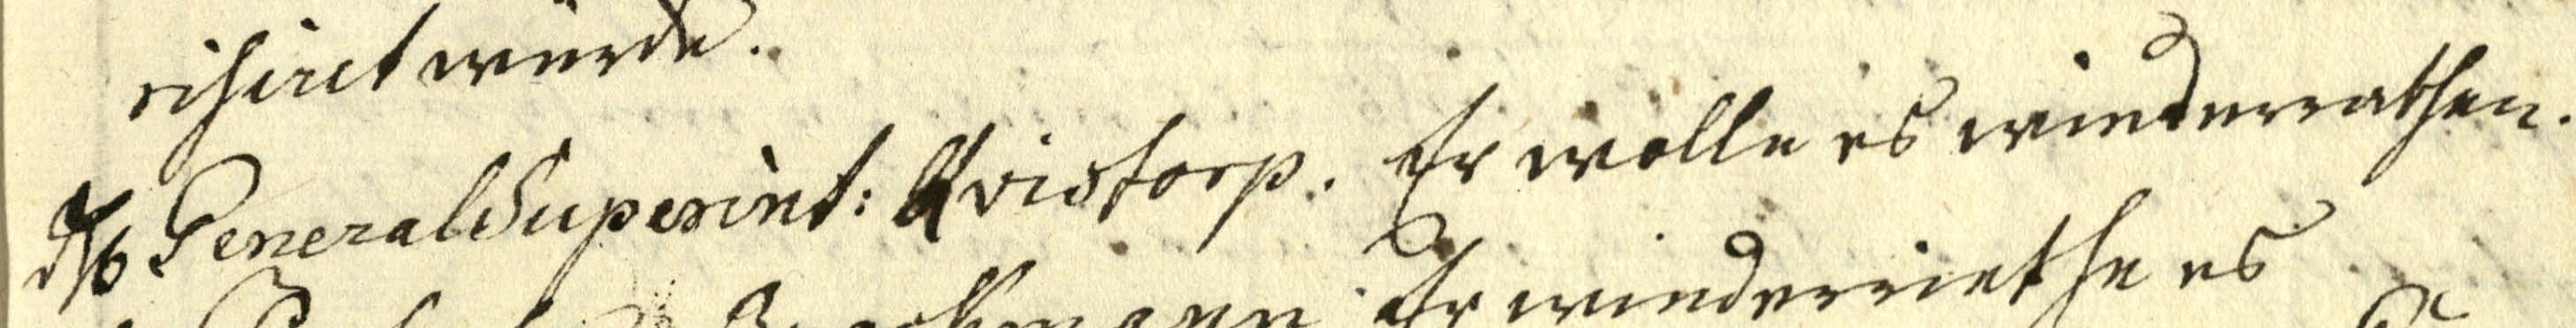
dh. GeneralSuperint. Quistorp. Er wolle es wiederrathen.
